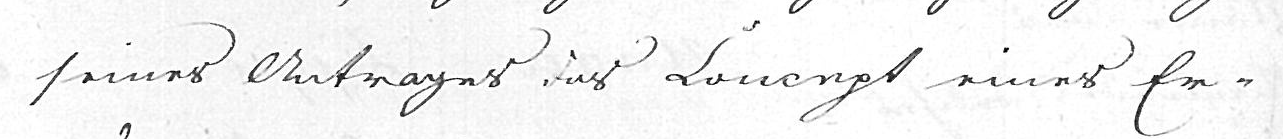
seines Antrages das Concept eines Er-
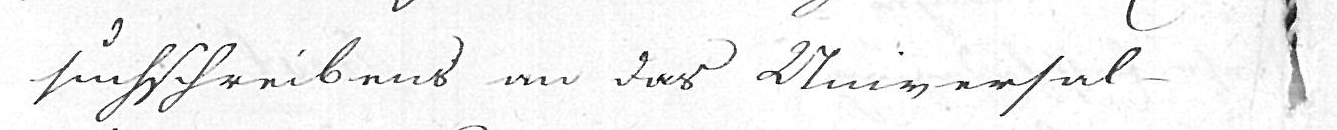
suchschreibens an das Universal-
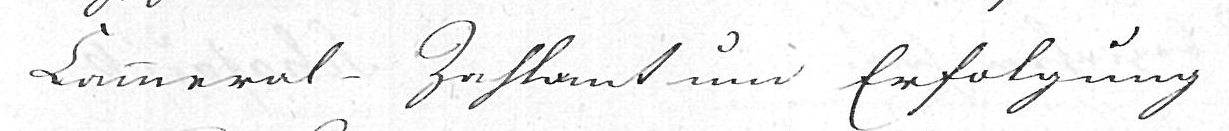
Cammeral-Zahlamt um Erfolgung
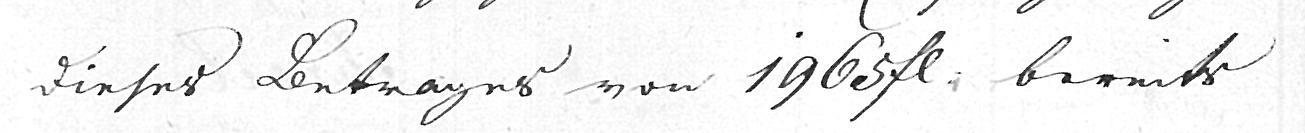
dieses Betrages von 1965 fl. bereits
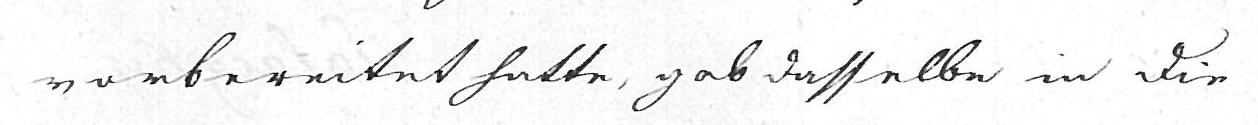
vorbereitet hatte, gab dasselbe in die Kanzlei
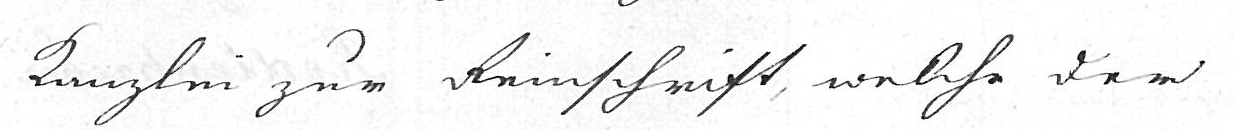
zur Reinschrift, welche der
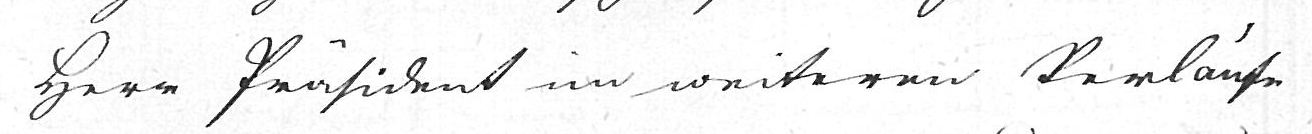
Herr Präsident im weiteren Verlaufe
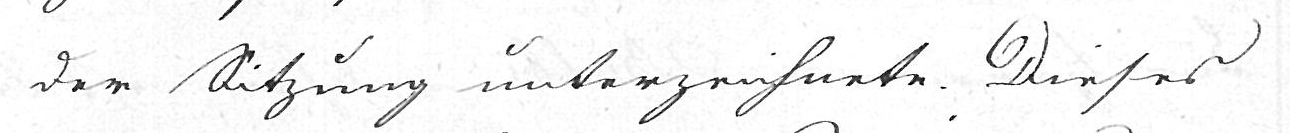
der Sitzung unterzeichnete. Dieses
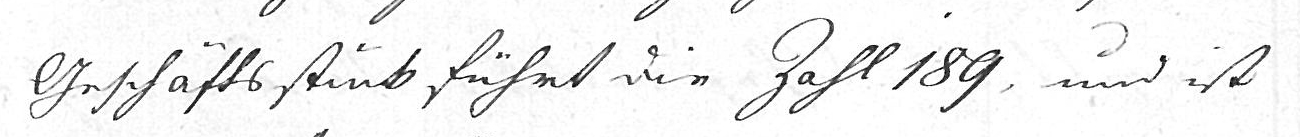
Geschäftsstück führ die Zahl 189, und ist
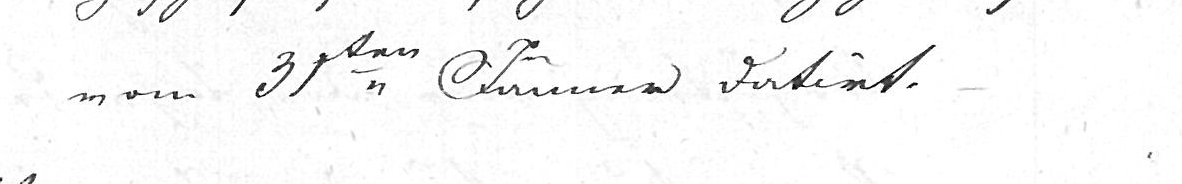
vom 31ten Jänner datirt.
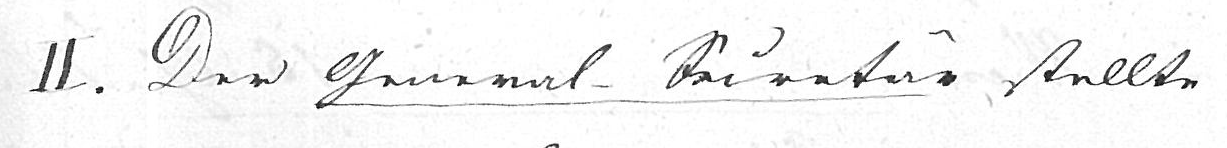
II. Der General-Secretär stellte
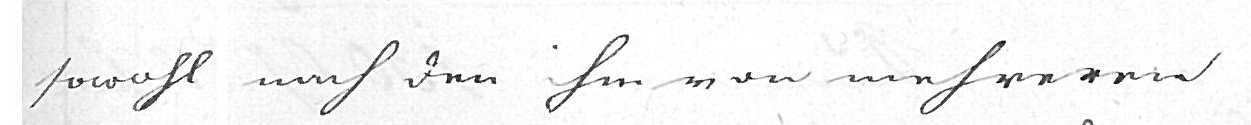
sowohl nach den ihm von mehreren
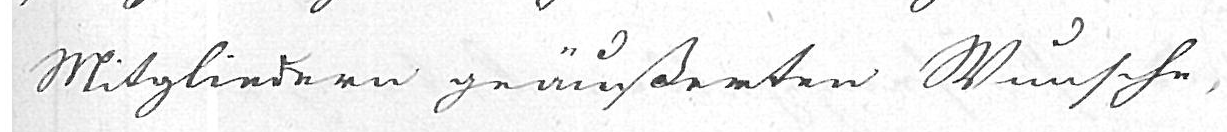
Mitgliedern geäußerten Wunsche
